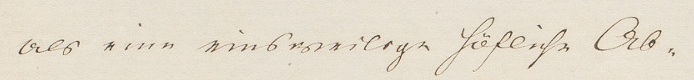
als eine einsweilige höfliche Ab-
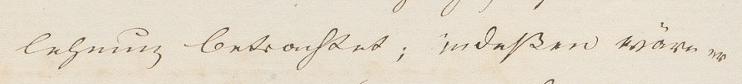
lehnung betrachtet; indeßen wäre er
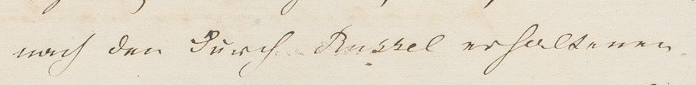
nach den durch Russel erhaltenen
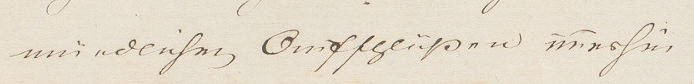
mündlichen Aufschlüßen immerhin
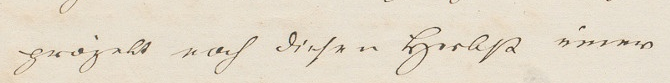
projekt noch diesen Herbst einer
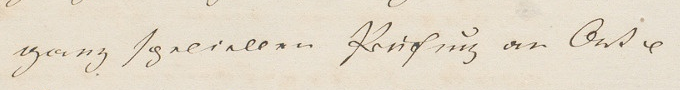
ganz speciellen Prüfung an Ort &
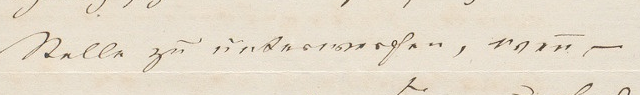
Stelle zu unterwerfen, wenn –
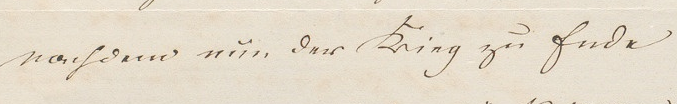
nachdem nun der Krieg zu Ende
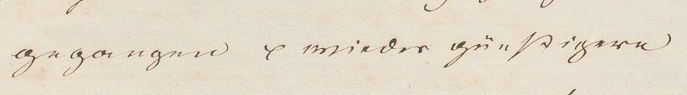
gegangen & wieder günstigere
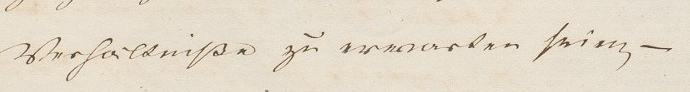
Verhältniße zu erwarten seien –
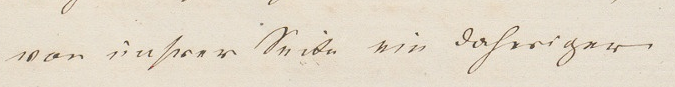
von unsrer Seite ein daheriger
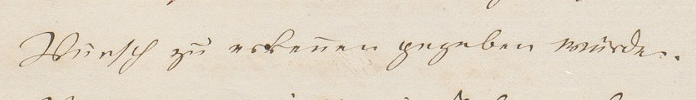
Wunsch zu erkennen gegeben würde.
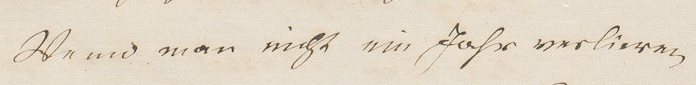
Wenn man nicht ein Jahr verlieren
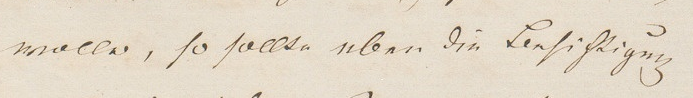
wolle, so sollte eben die Besichtigung
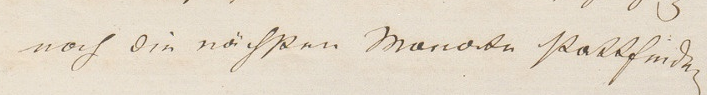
noch die nächsten Monate stattfinden,
